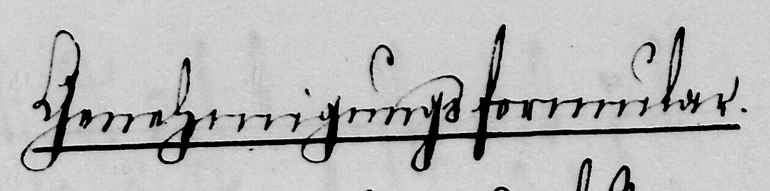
Genehmigungsformular
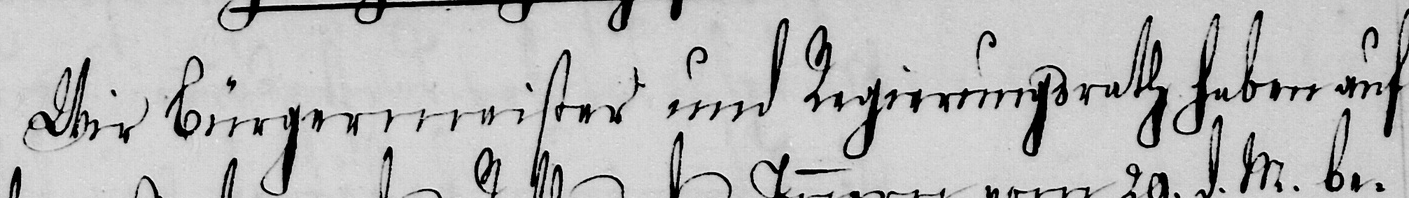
Wir Bürgermeister und Regierungsrath haben auf
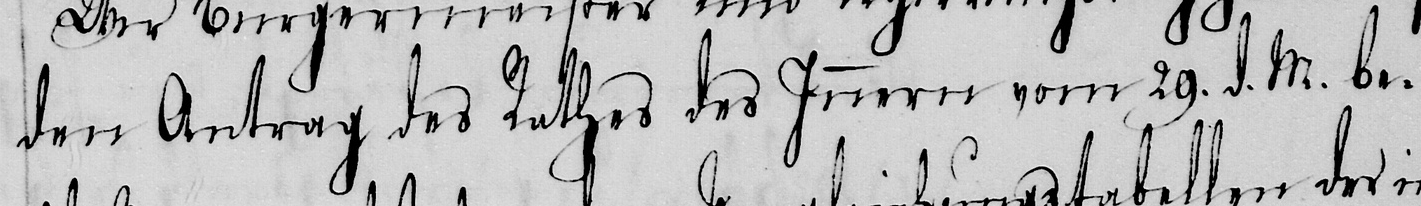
den Antrag des Rathes des Innern vom 29. d. M. be¬
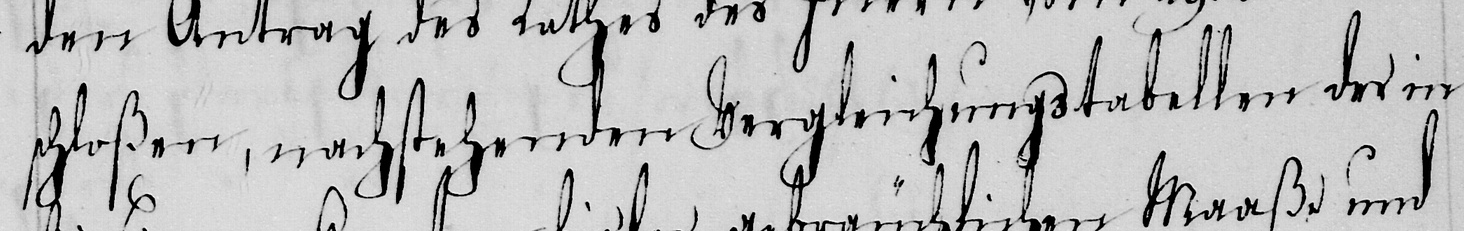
schloßen, nachstehenden Vergleichungstabellen der in
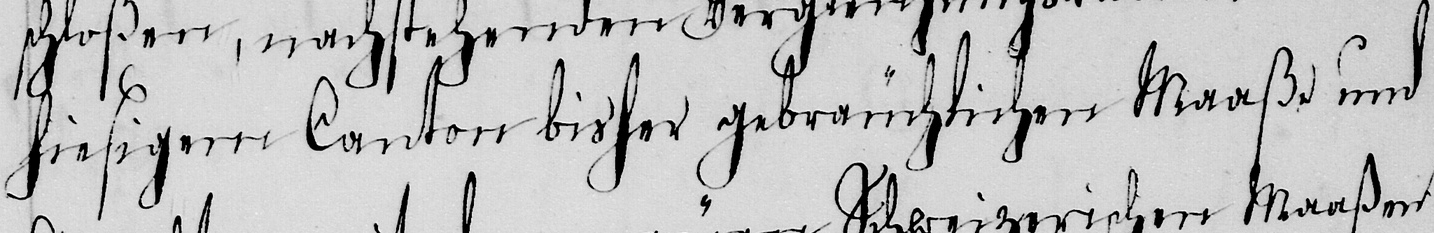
hiesigem Canton bisher gebräuchlichen Maaße und
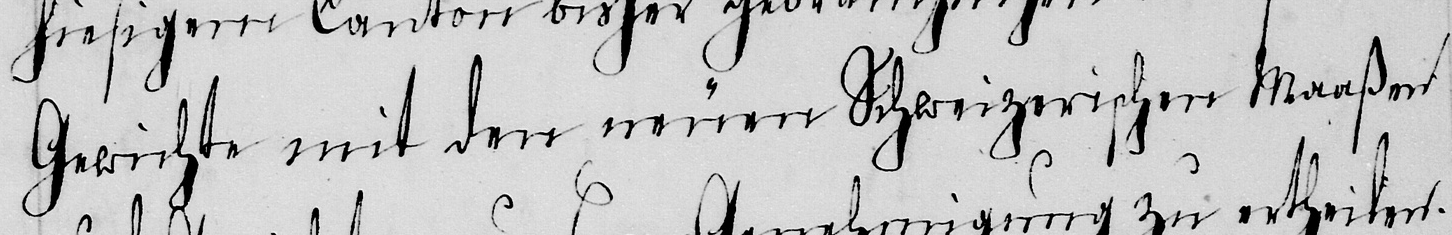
Gewichte mit den neuen Schweizerischen Maaßen
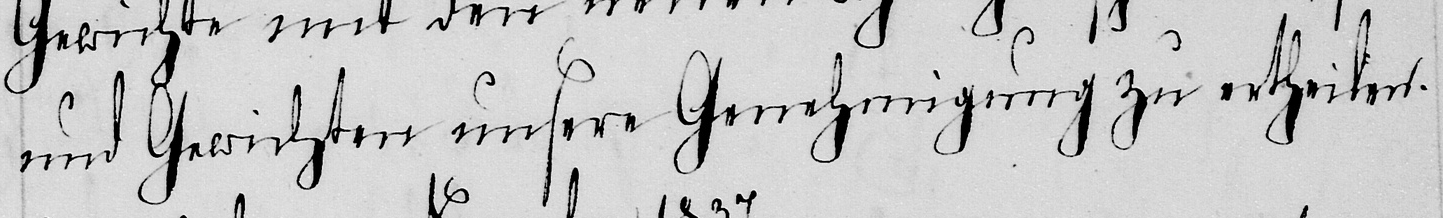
und Gewichten unsere Genehmigung zu ertheilen.
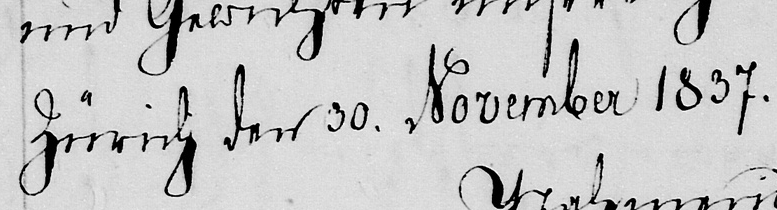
Zürich den 30. November 1837.
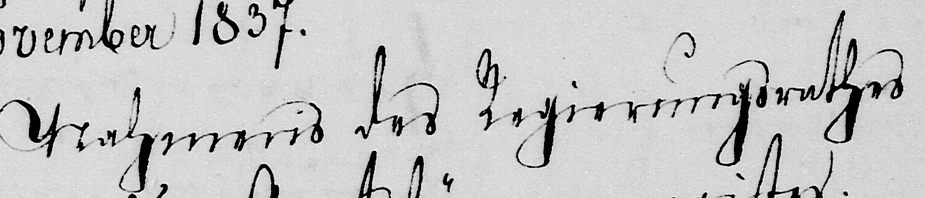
Nahmens des Regierungsrathes
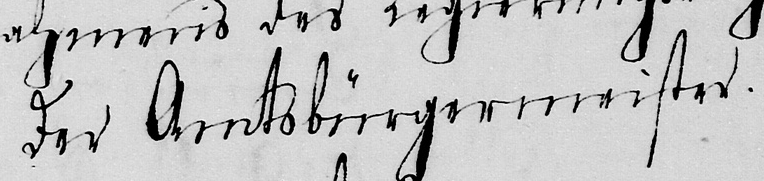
Der Amtsbürgermeister.
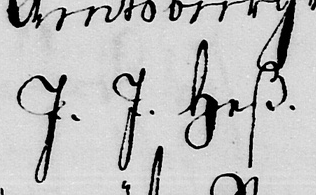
J. J. Heß.
